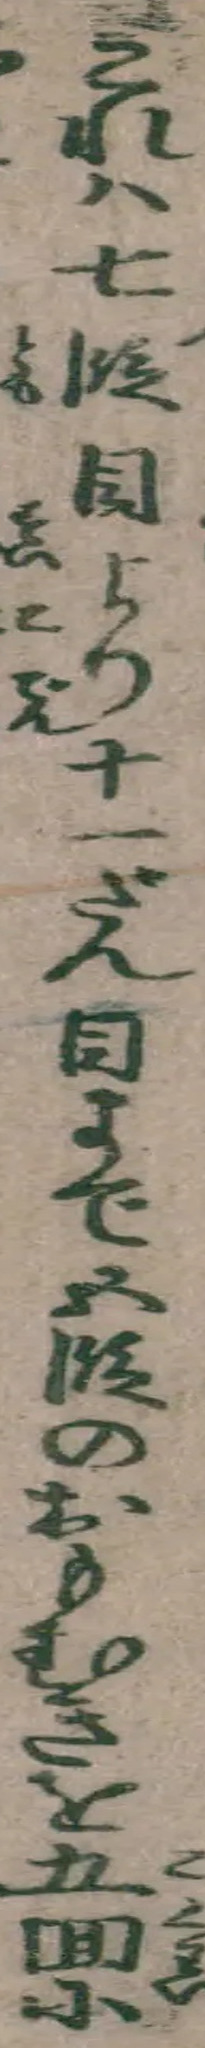これは七段目より十一だん目まで五段のおもむきを五回に
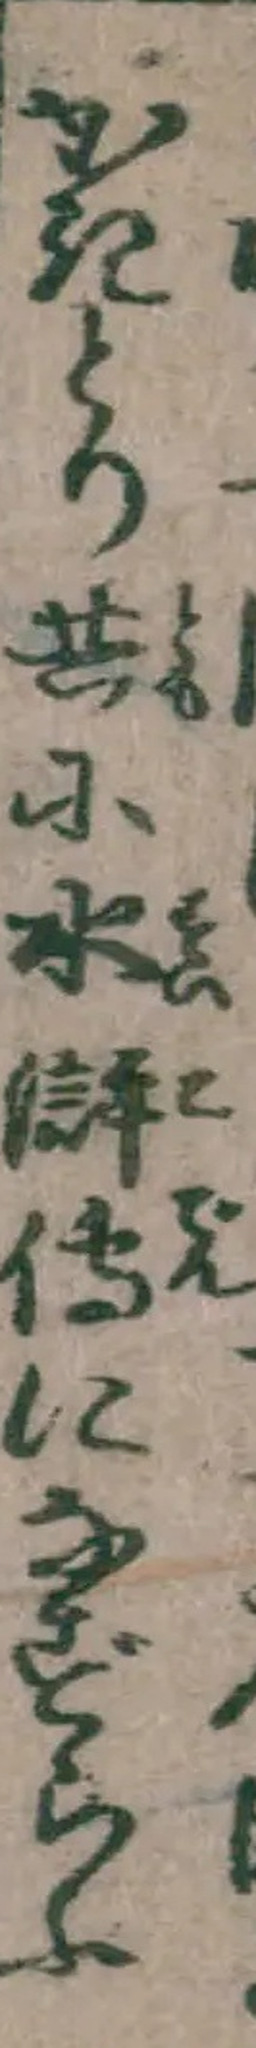かきとり共に水滸伝になずらふ
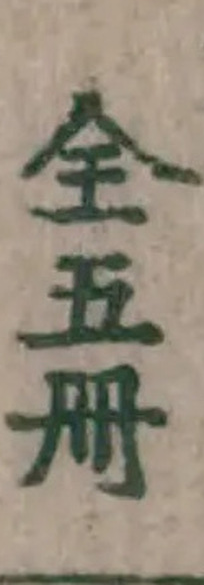全五冊
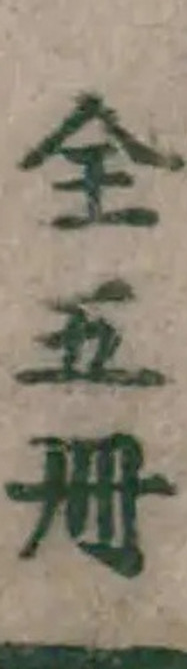全五冊
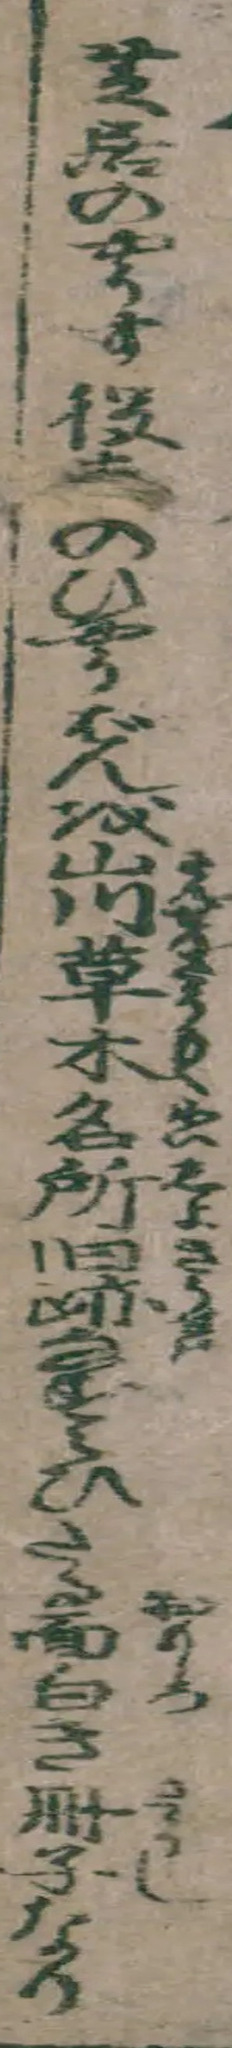芝居のやうす役者のひやうばんを山川草木名所旧跡なずらひたる面白き冊子なり

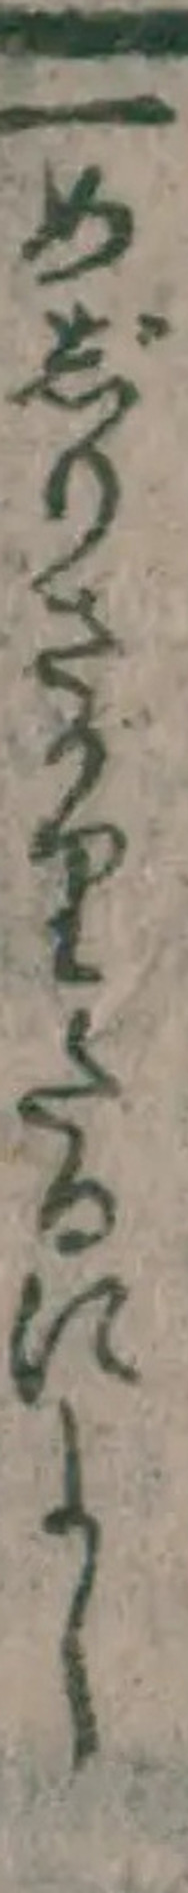一めじりさかりたるによし
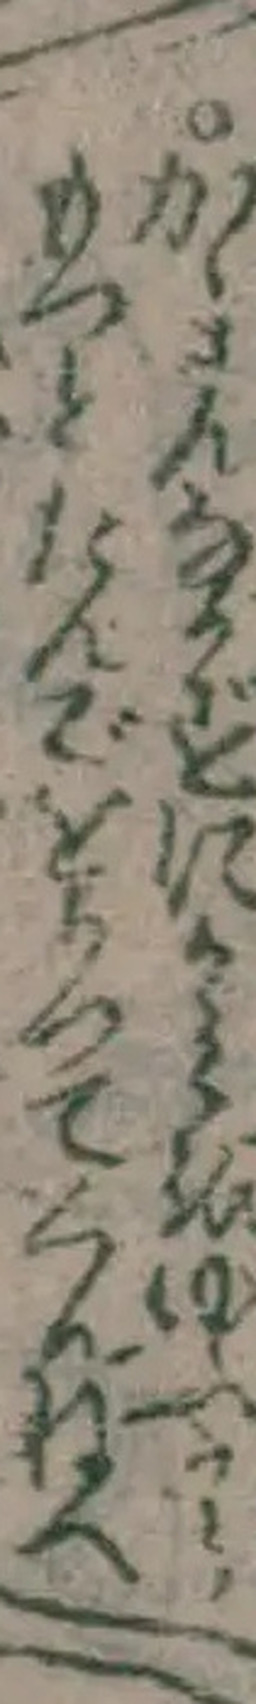もつとたんごをかつてくんねへ
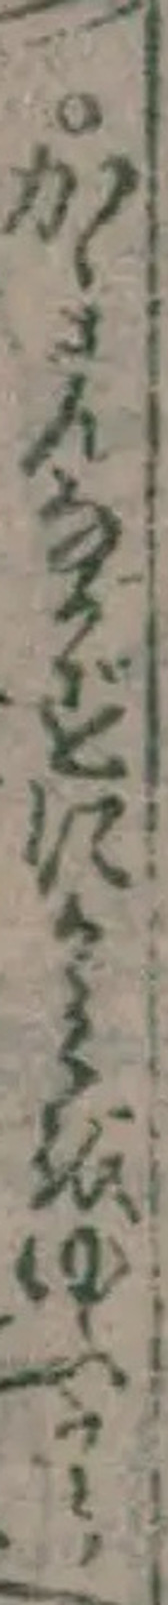〇かゝさんなかずにかみをゆふから
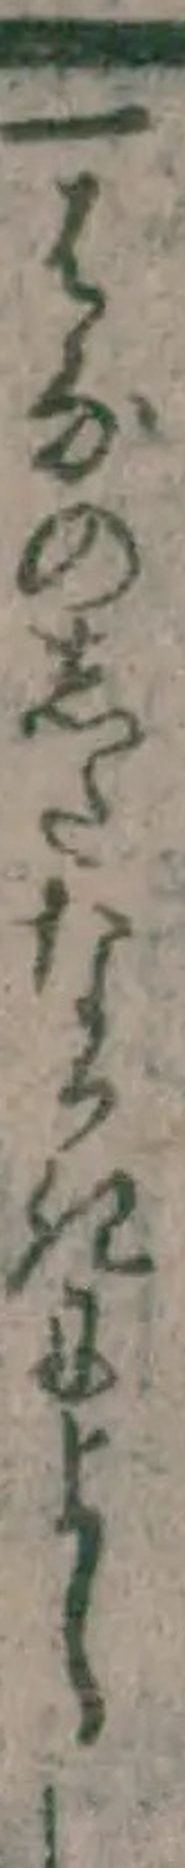一はなのしたなかきによし
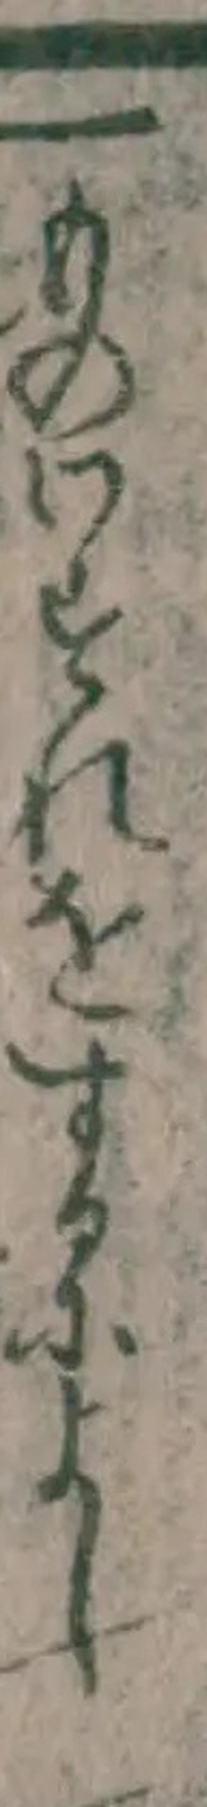一ものわすれをするによし
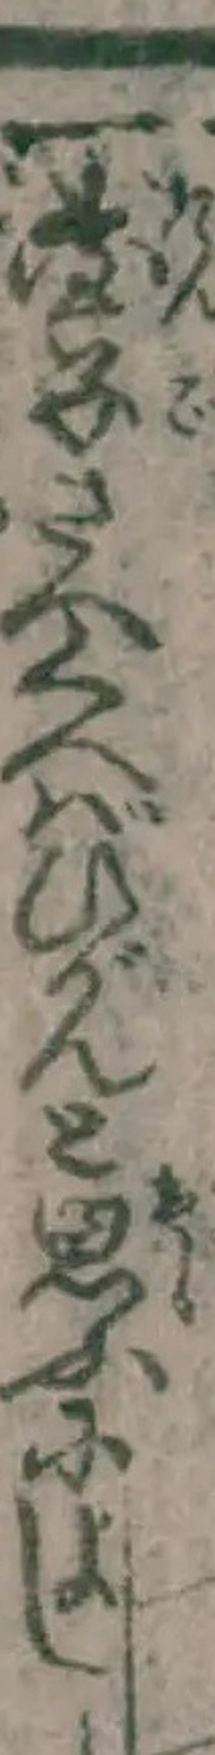一団子さへくへばひがんと思ふによし
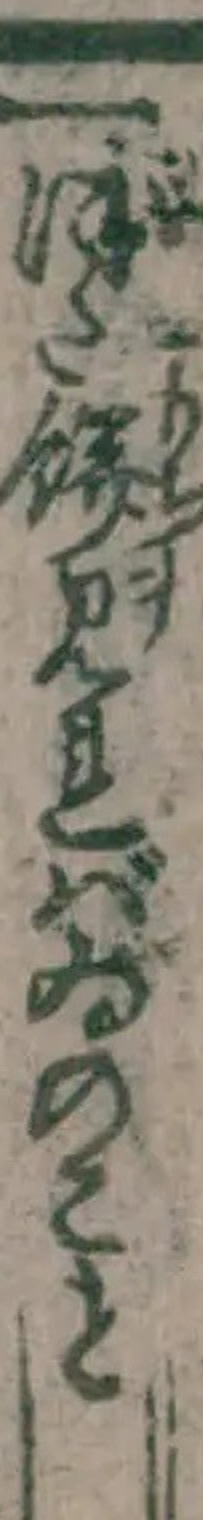一ほた餅を見ればのこと
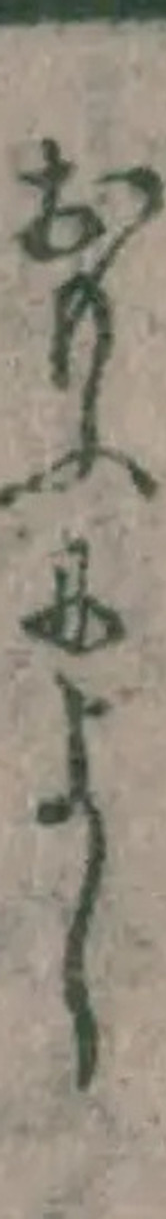おもふによし
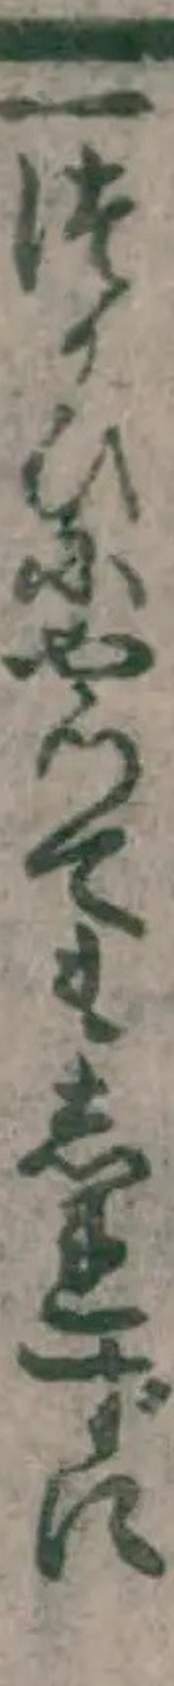一つかひにやつてもしれずに
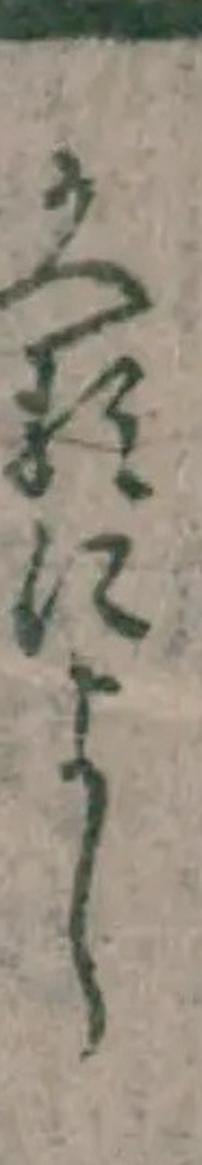かへるによし
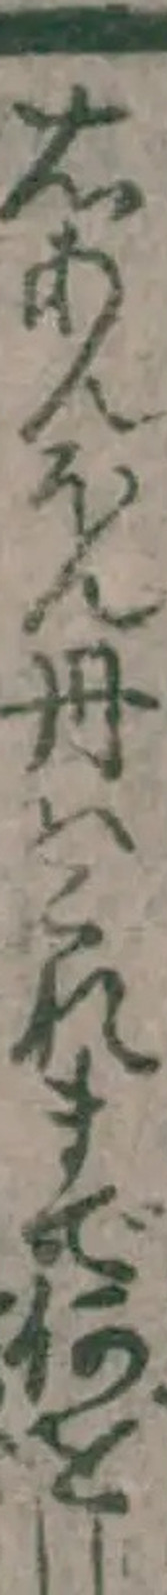右あんほん丹はこれまで何を
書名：視薬霞報条 3巻
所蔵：国立国会図書館 National Diet Library, JAPAN
